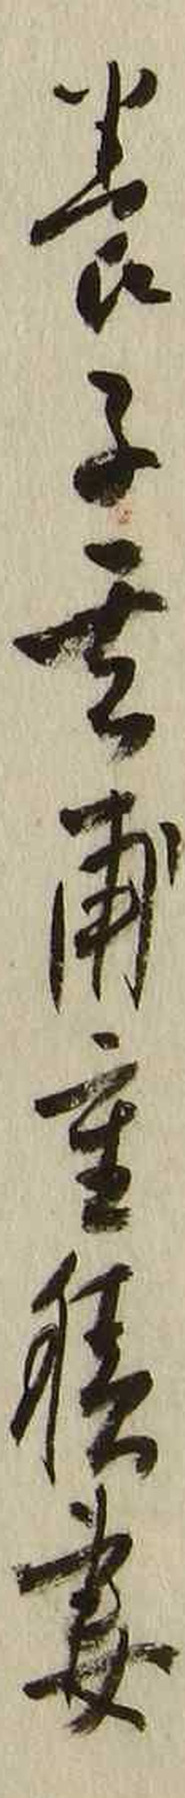女養子玄甫重積妻
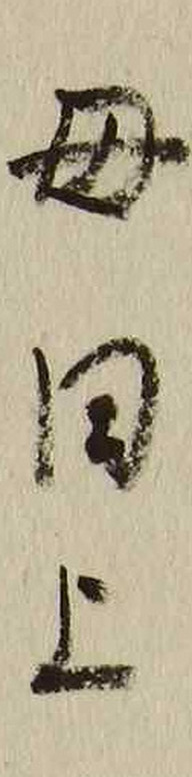母同上
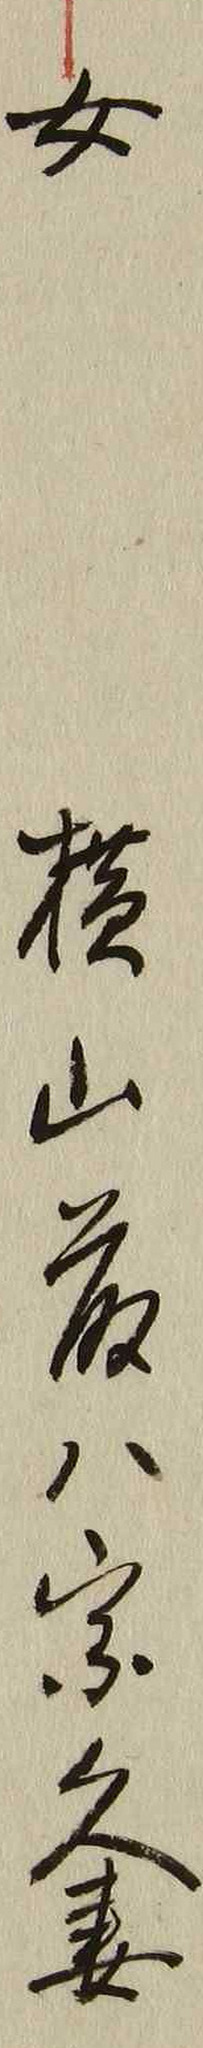女横山藤ハ宗久妻
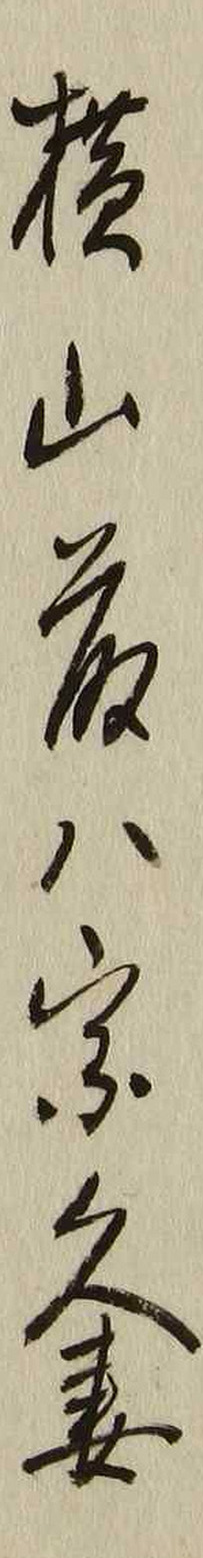女横山藤ハ宗久妻
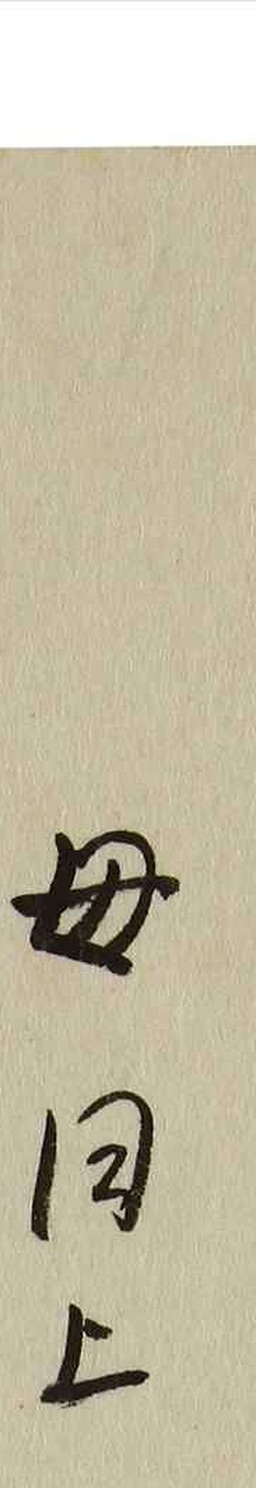母同上
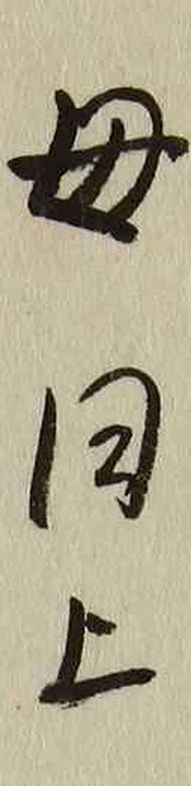母同上
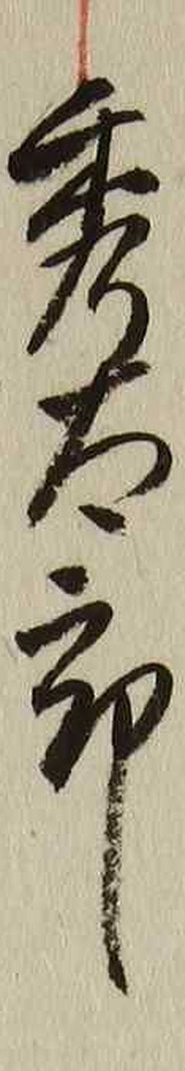秀太郎
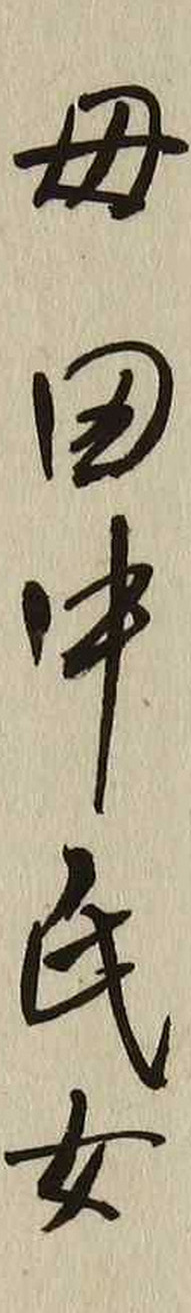母田中氏女
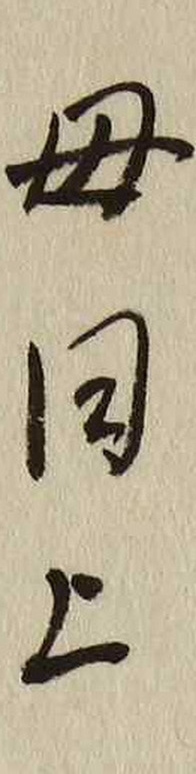母同上

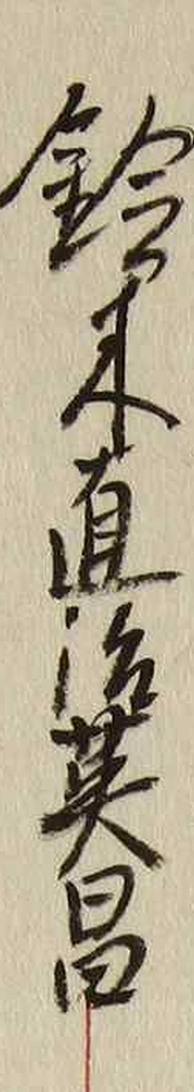鈴木直治英昌
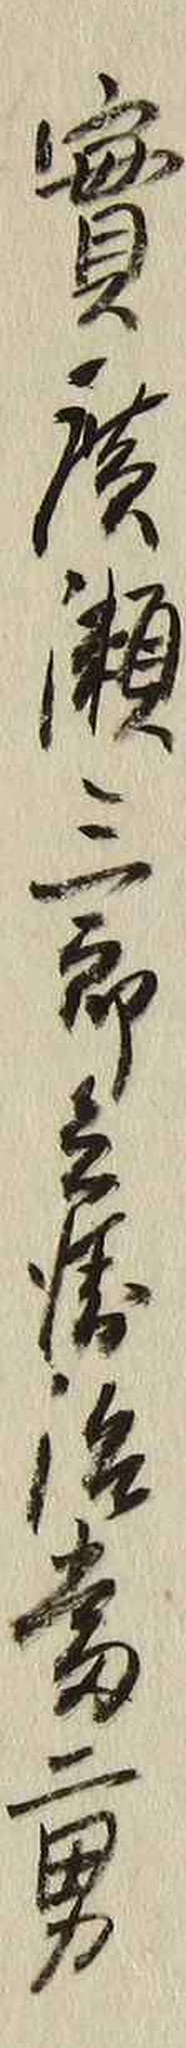実広瀬三郎兵衛治当二男
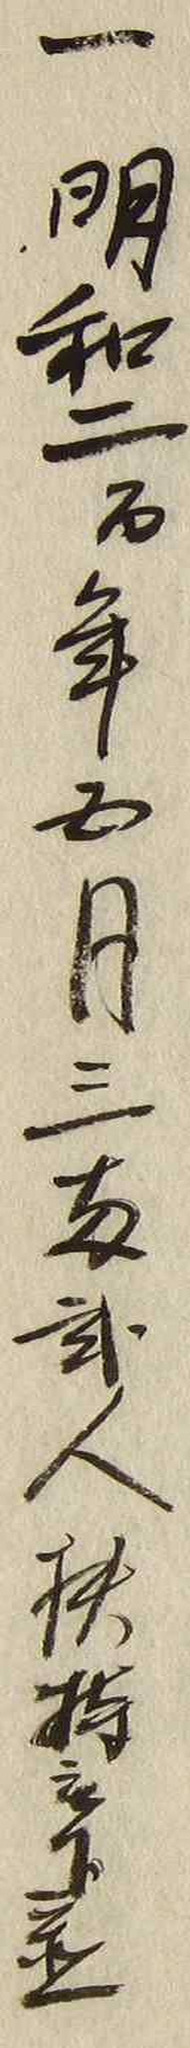一明和二酉年五月三両弐人扶持被下置

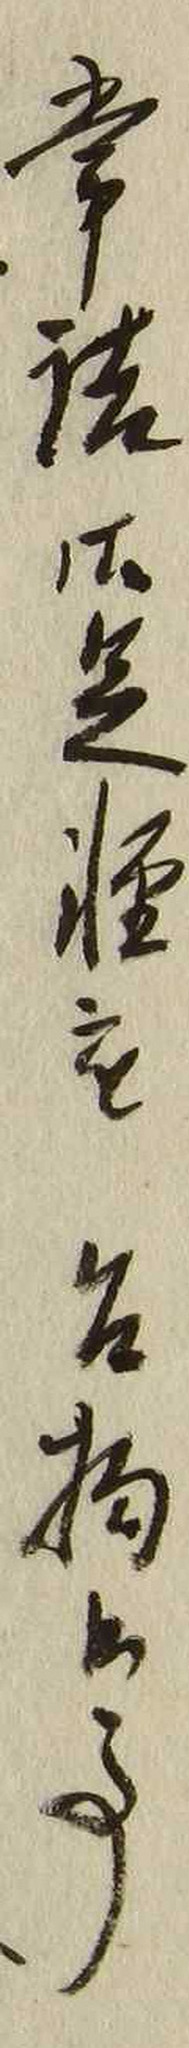常詰御足軽被召抱候事
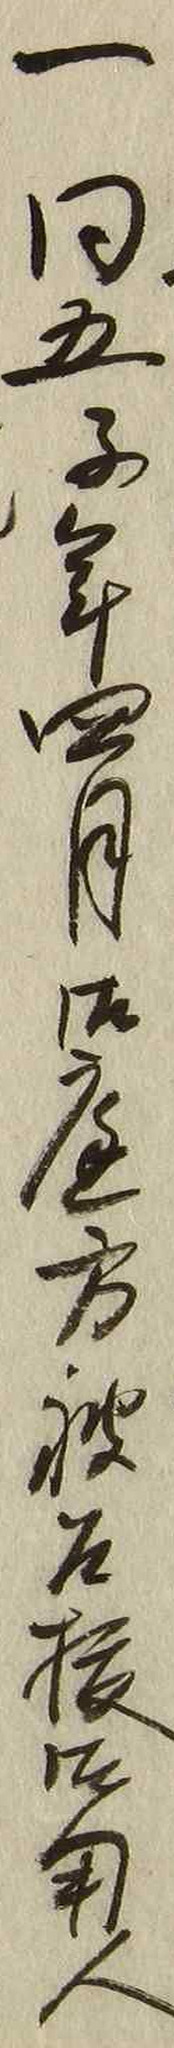一同五子年四月御庭方被召抜御用人
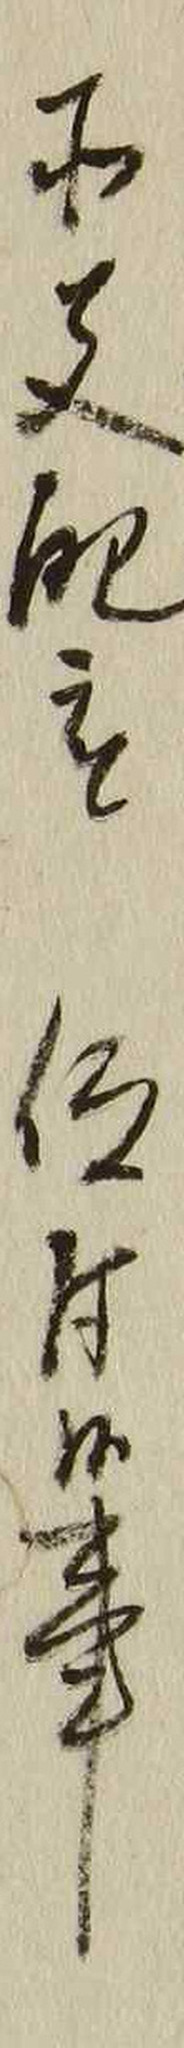所支配被仰付候事
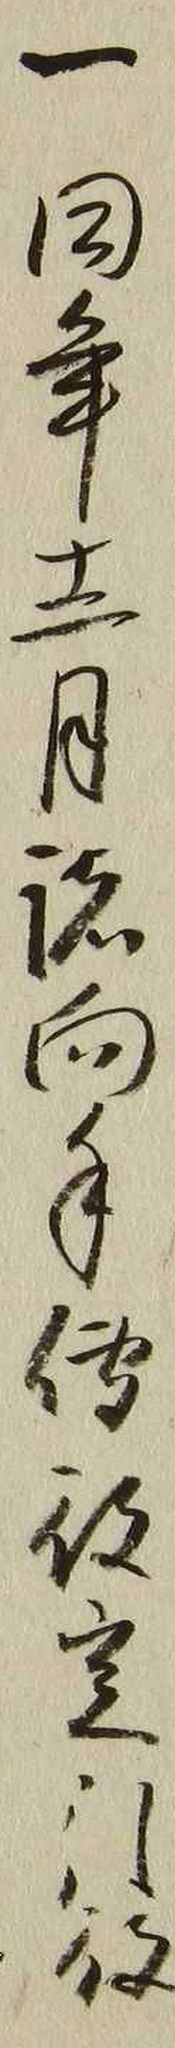一同年十二月諸向手伝役定引役
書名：諸士系譜　巻之353　す之部3
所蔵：会津若松市立会津図書館
